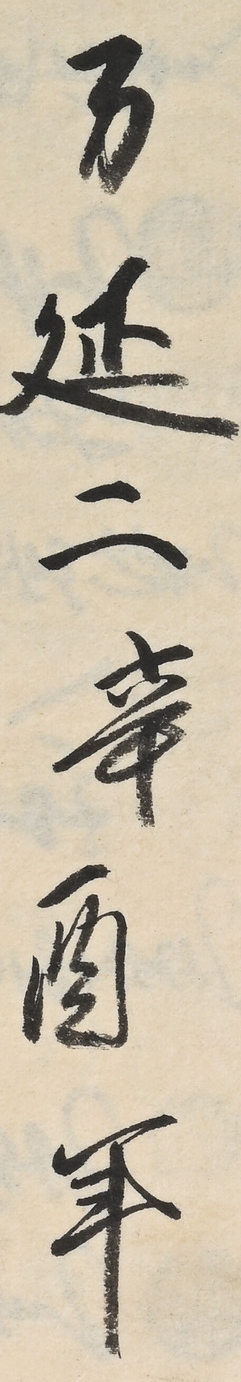㊞万延二辛酉年
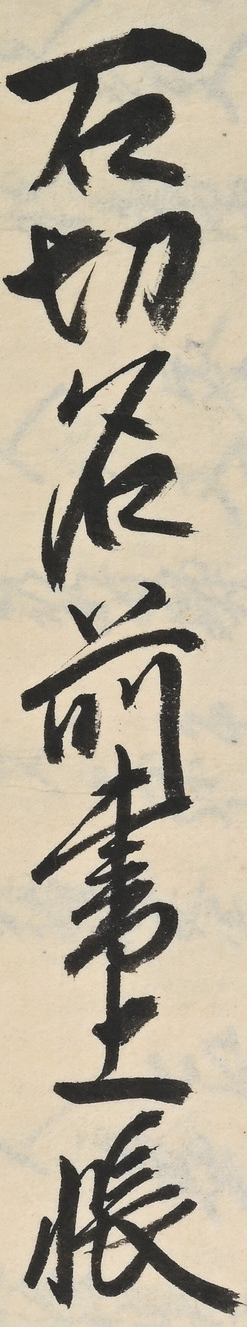石切名前書上帳

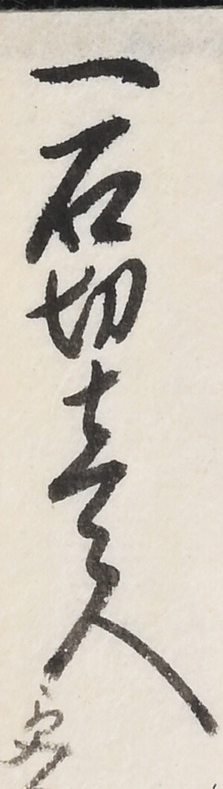一石切壱人
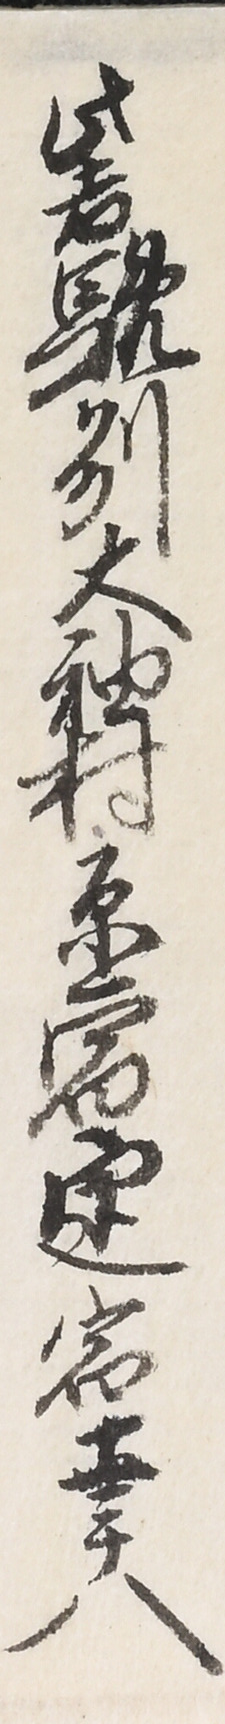此者駿州大袖村原宿定宿幸八
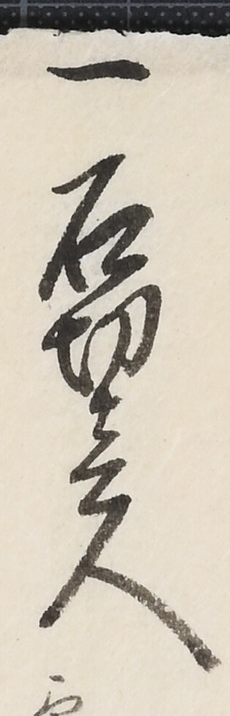一石切壱人
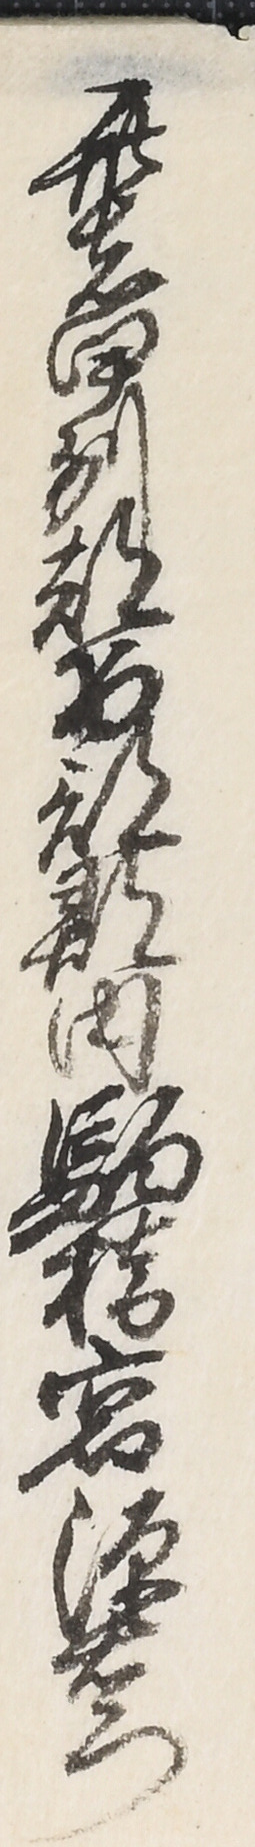此者甲州都留郡郡内駒橋宿源右衛門
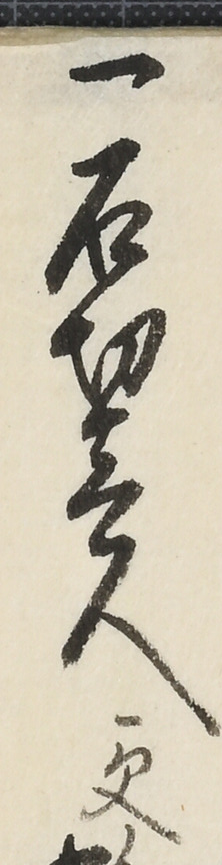一石切壱人
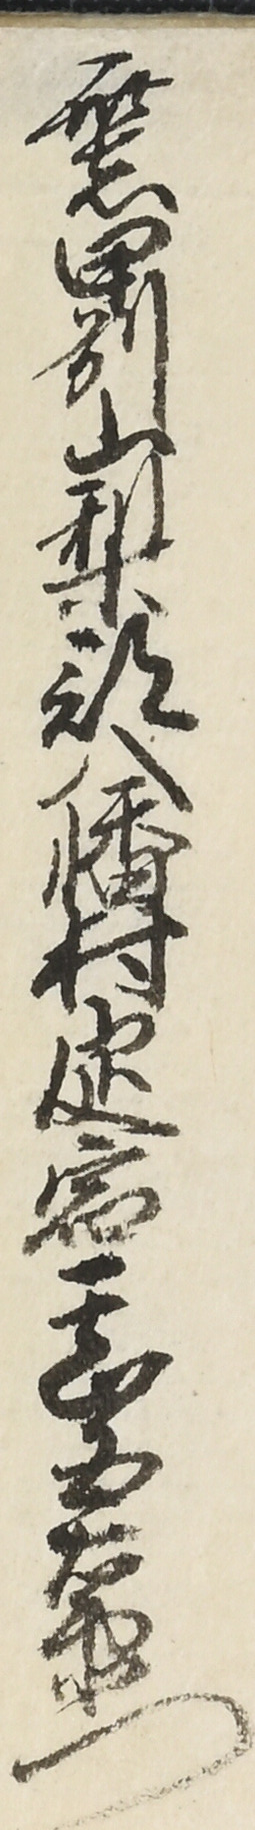此者甲州山梨郡八幡村定宿甚五右衛門
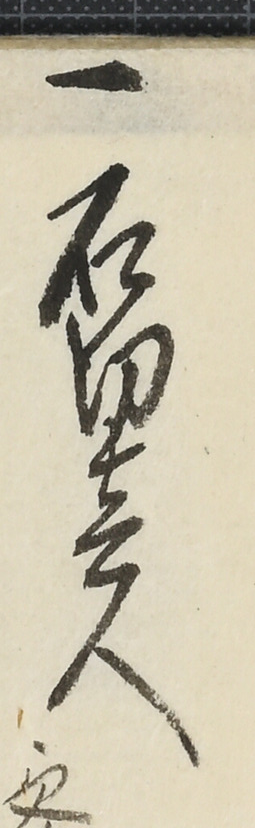一石切壱人

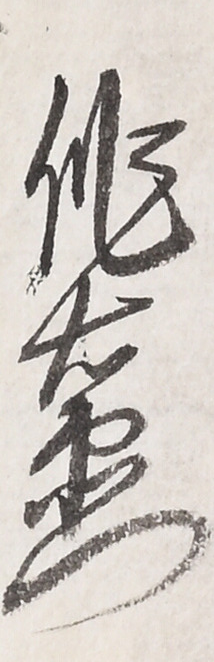作右衛門
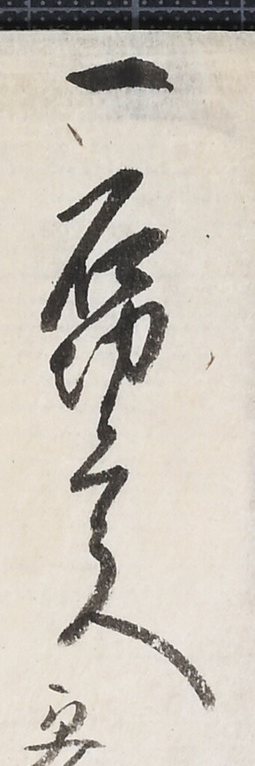一石切壱人
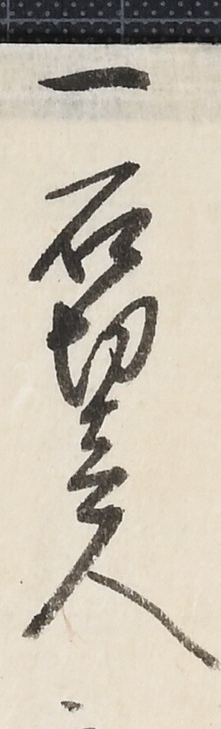一石切壱人
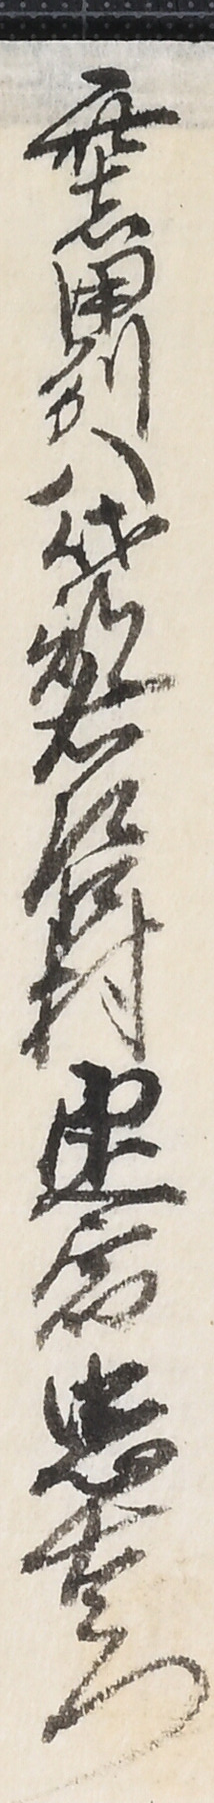此者甲州八代郡右左口村定宿忠右衛門
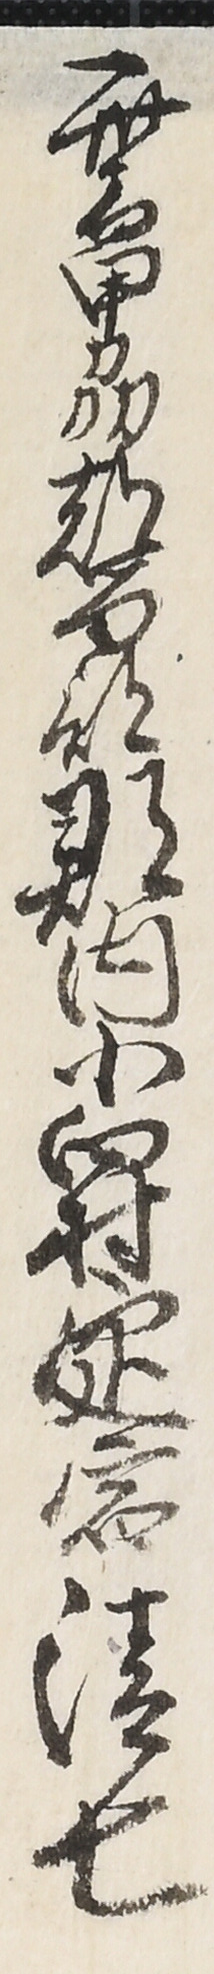此者甲州都留郡郡内小田村定宿清七
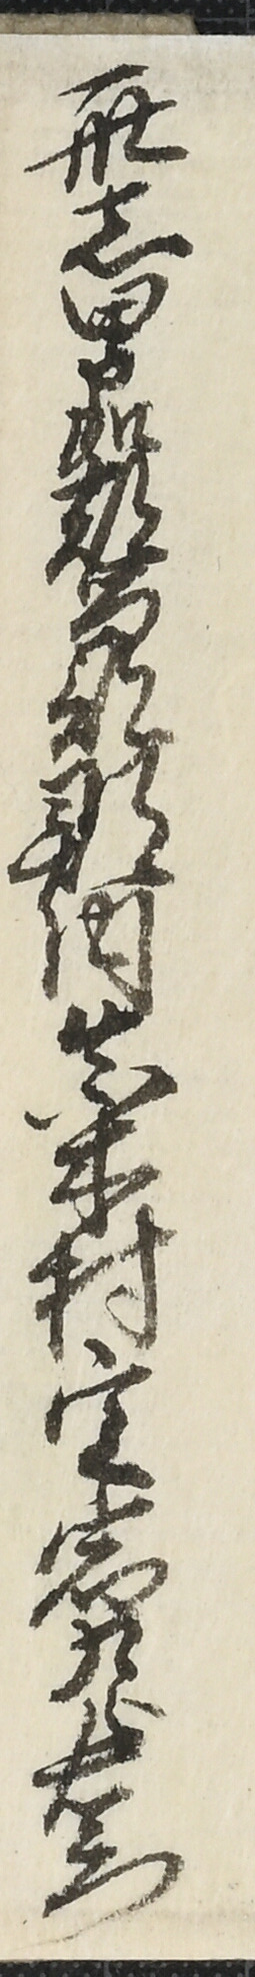此者甲州都留郡郡内真木村定宿九郎右衛門
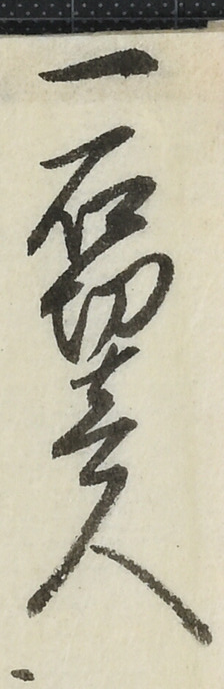一石切壱人
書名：万延二辛酉年正月石切名前書上帳
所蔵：伊那市立高遠町図書館・合同会社AMANE
